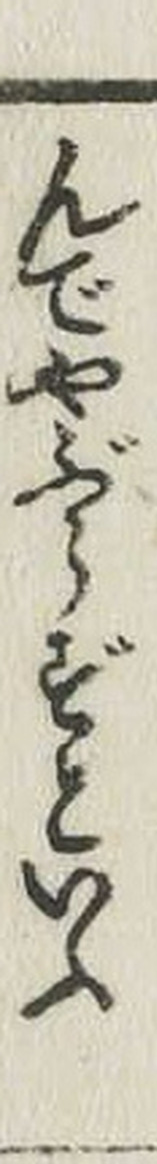んでやぶらずといふ
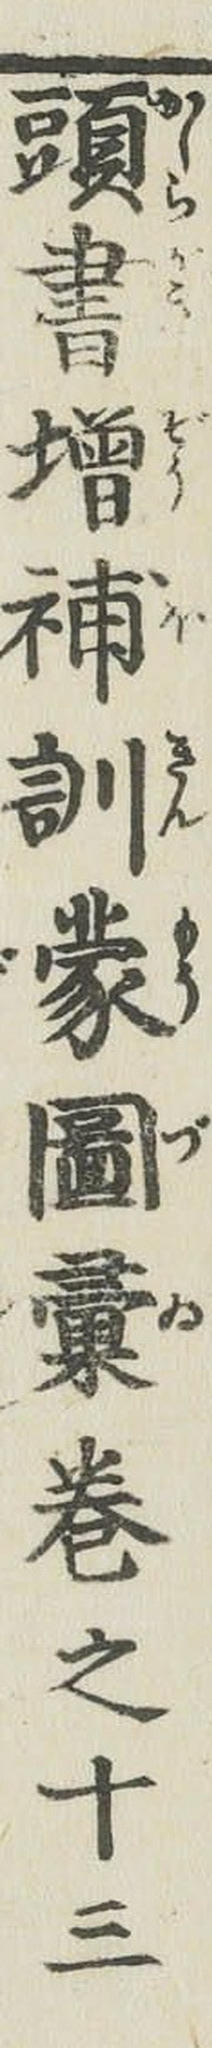頭書増補訓蒙図彙巻之十三
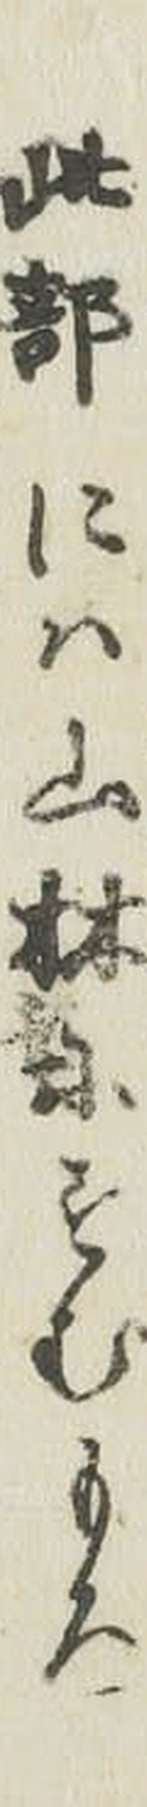此部には山林にすむもろ
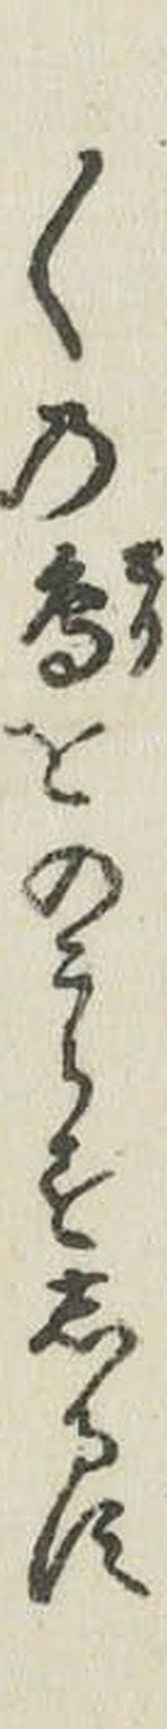〳〵の鳥をのこらすしるす
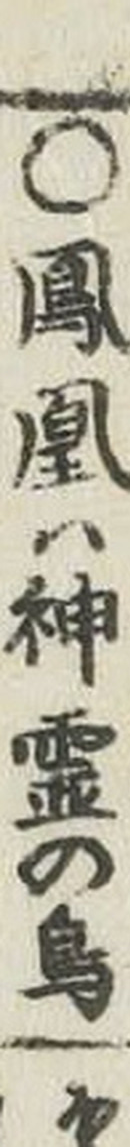○鳳凰は神霊の鳥
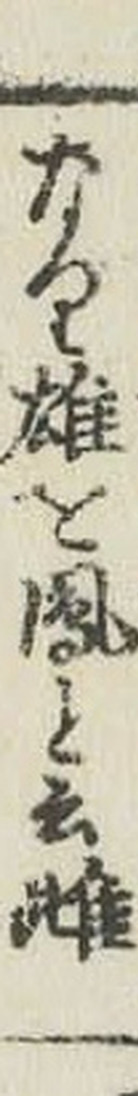なり雄を鳳と云雌
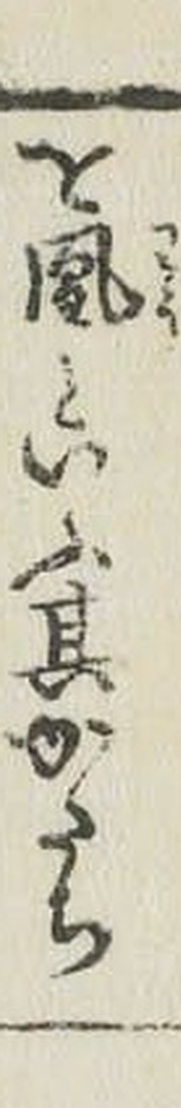を凰といふ其かたち
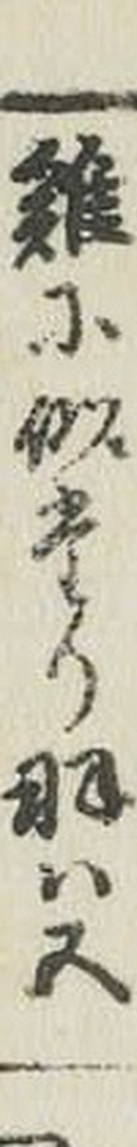鶏に似たり羽は五
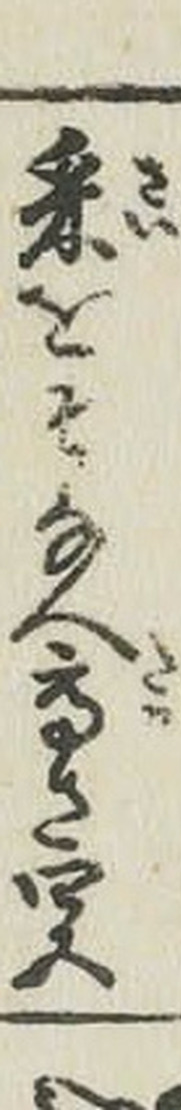采をそなへ高さ四五
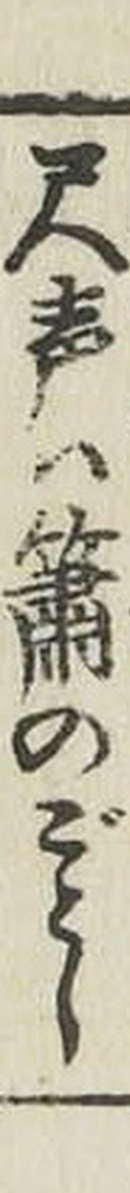尺声は簫のごとし
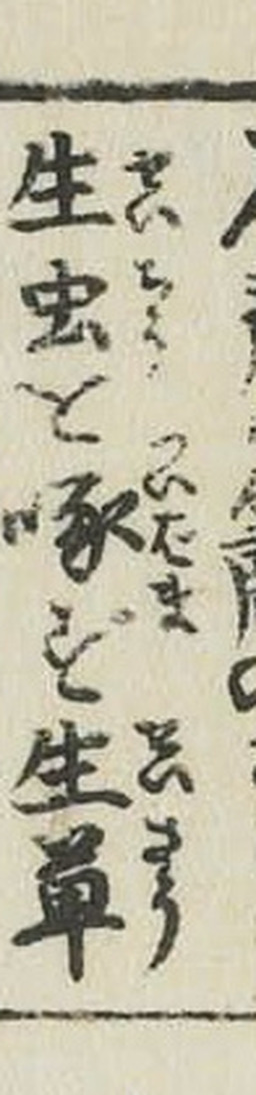生虫を啄ず生草
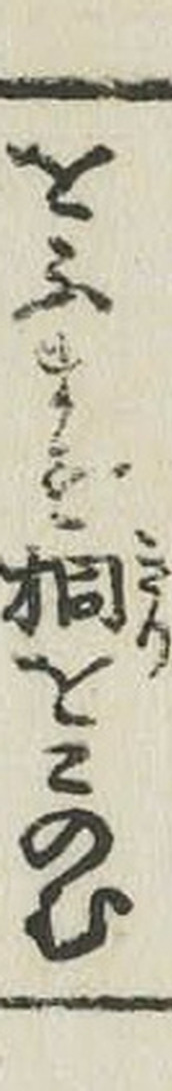をふまず桐をこのむ
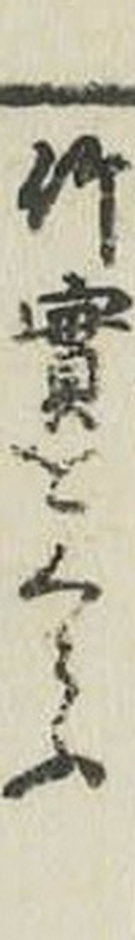竹実をくらふ
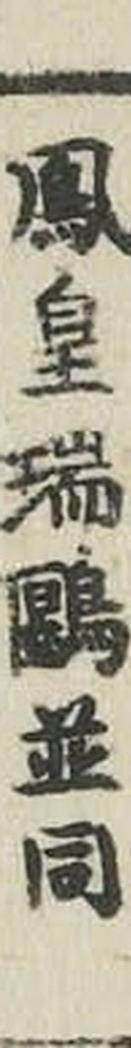鳳皇瑞鶠並同

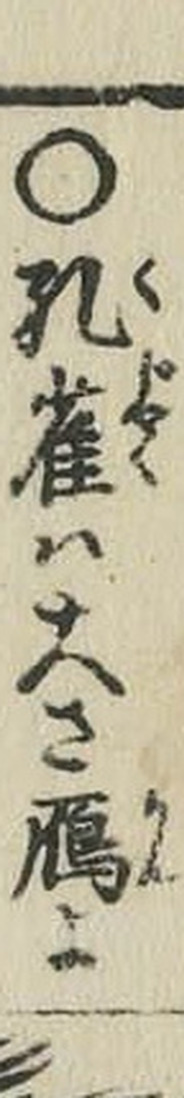○孔雀は大さ雁よ
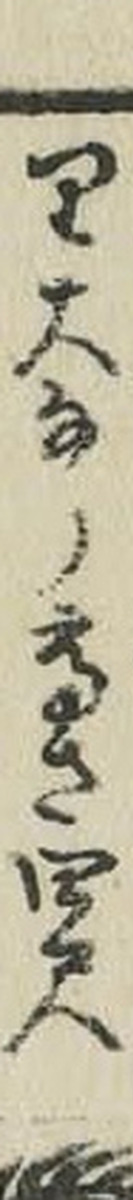り大なり高さ四尺
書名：増補頭書訓蒙図彙大成 10巻 6:巻之12-13
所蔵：東京学芸大学教育コンテンツアーカイブ
